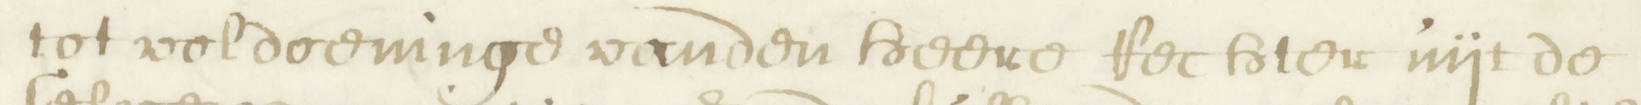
tot voldoeninge vanden heere Rechter uijt de
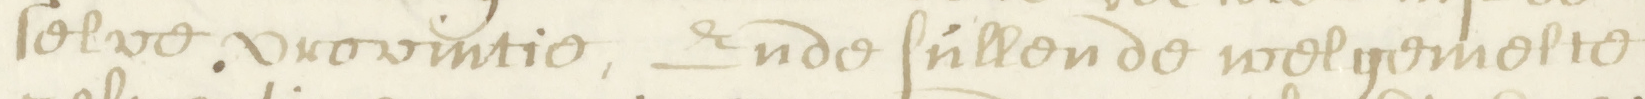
selve provintie. Ende sullen de welgemelte
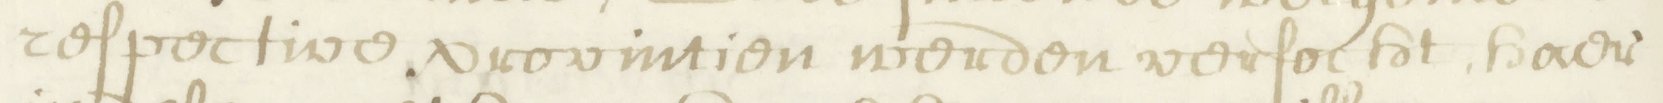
respective provintien werden versocht, haer
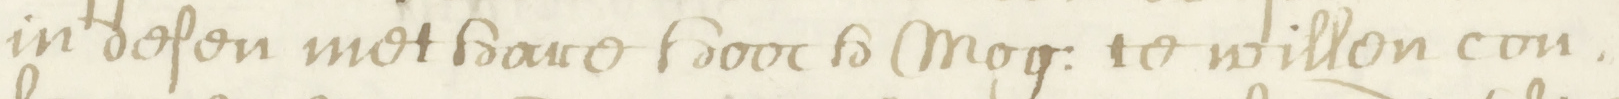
in desen met hare hooch Mog: te willen con„
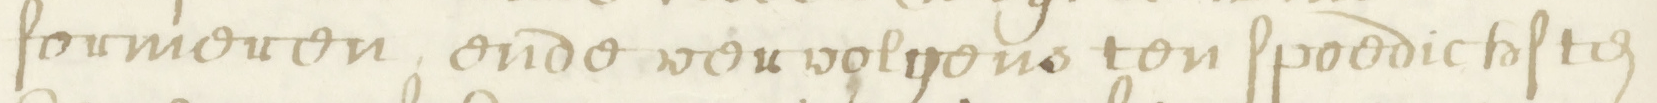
formeren, ende vervolgens ten spoedichsten
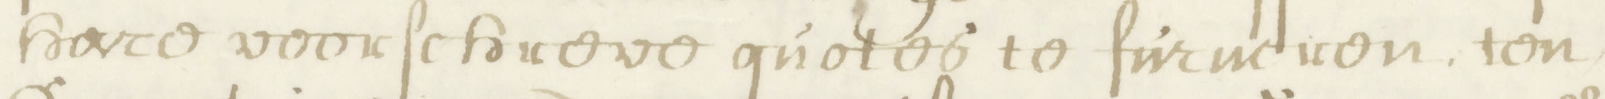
hare voorschreve quotes te furneren, ten
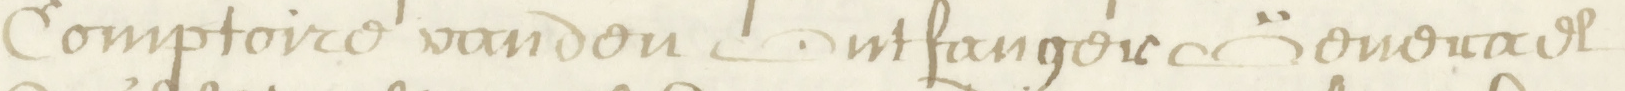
Comptoire vanden Ontfanger Generael
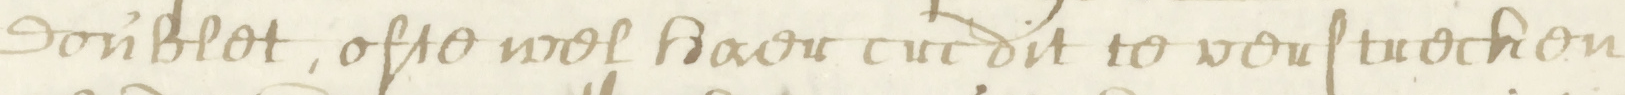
Doublet, ofte wel haer credit te verstrecken
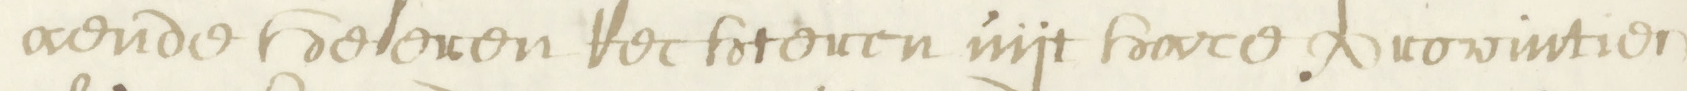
aende Heeren Rechteren uijt hare provintien
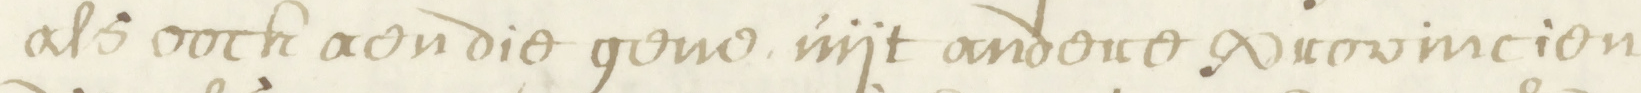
als oock aen die gene uijt andere provincien
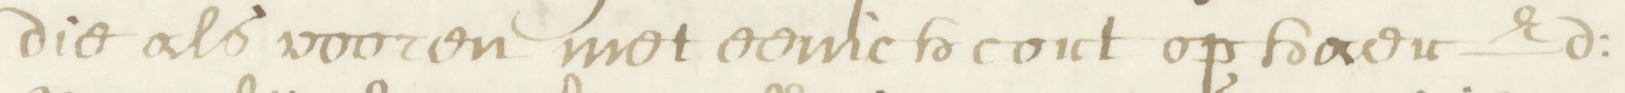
die als vooren met eenich cort op haer Ed:
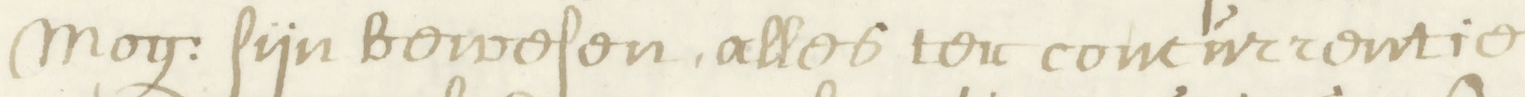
Mog: sijn bewesen, alles ter concurrentie
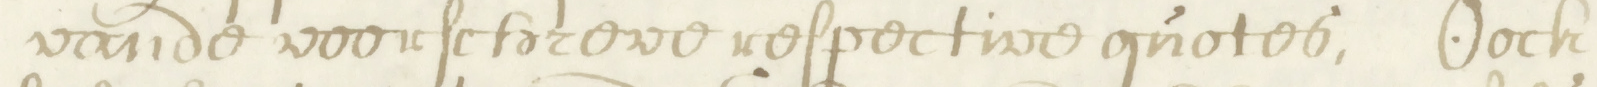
vande voorschreve respective quotes. Oock
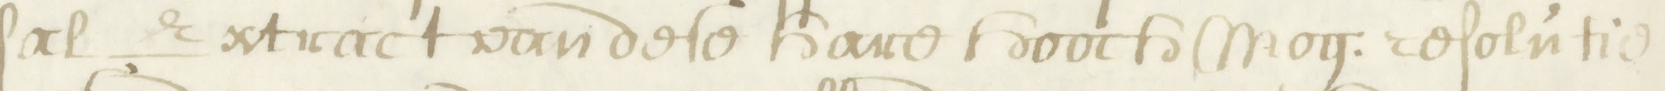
sal Extract van dese hare hooch Mog: resolutie
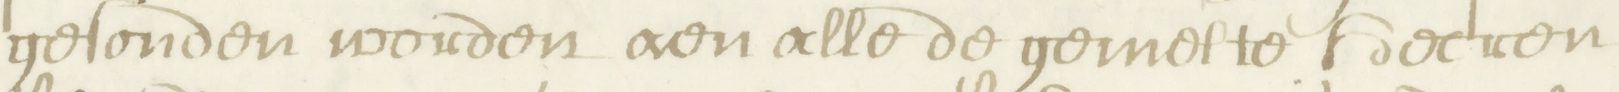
gesonden worden aen alle de gemelte heeren
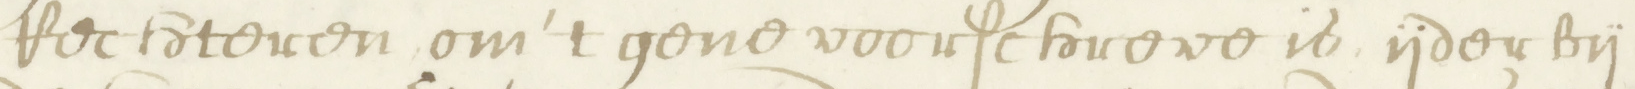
Rechteren, om't gene voorschreve is, ijder bij
